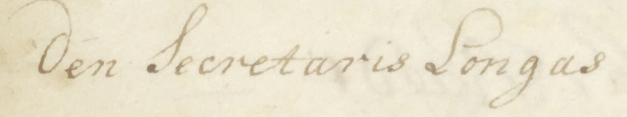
den Secretaris Longas
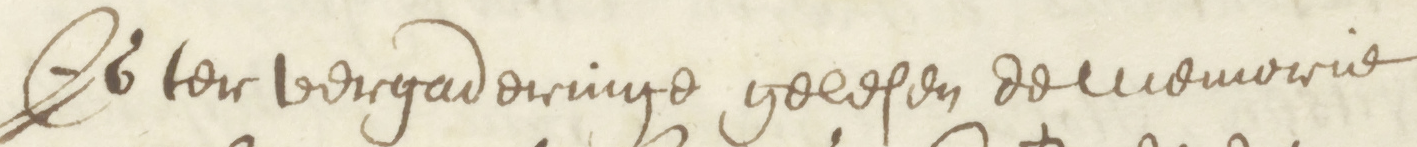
Is ter vergaderinge gelesen de memorie
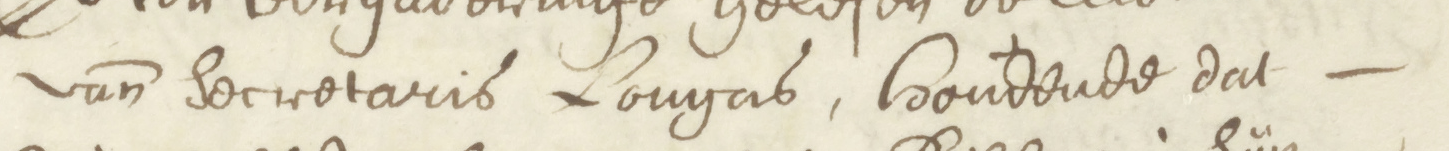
van Secretaris Longas, houdende dat —
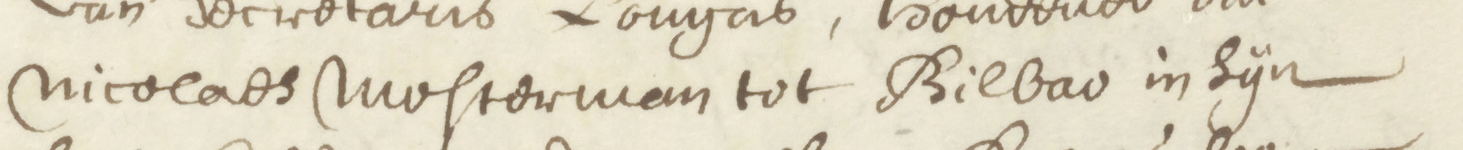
nicolaes Mosterman tot Bilbao in sijn
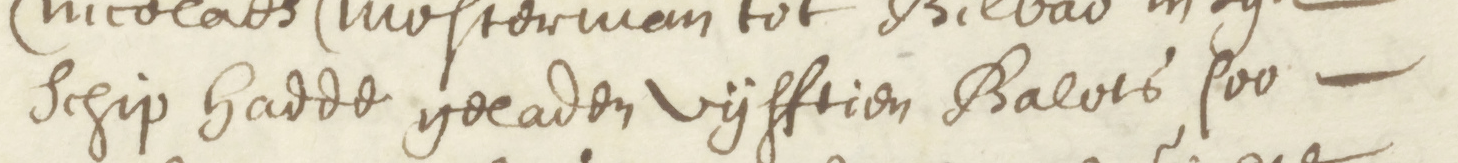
schip hadde geladen vijfftien Balots soo —
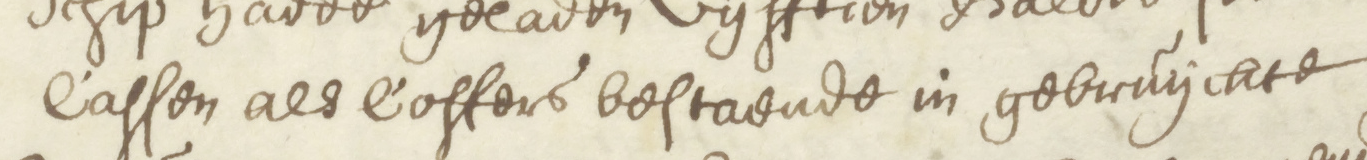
cassen als coffers bestaende in gebruijckte
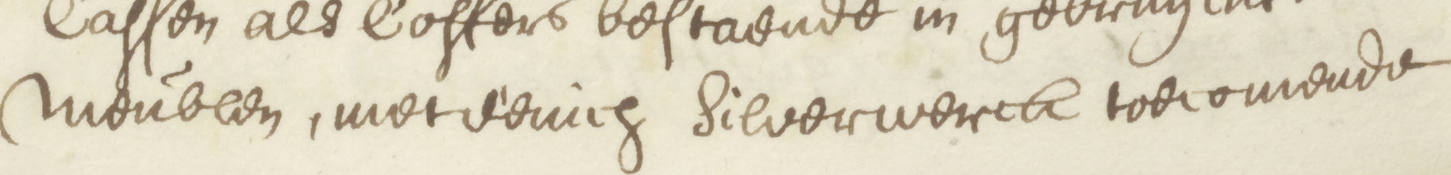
meublen, met eenich silverwerck toecomende
